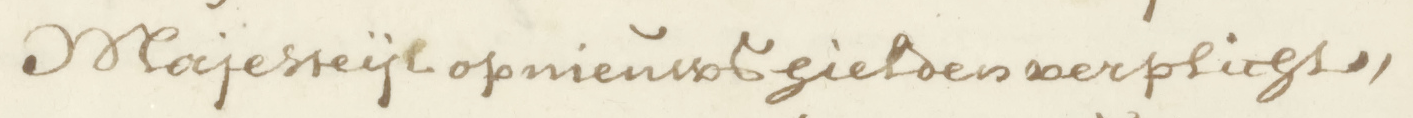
Majesteijt opnieuws hielden verplicht
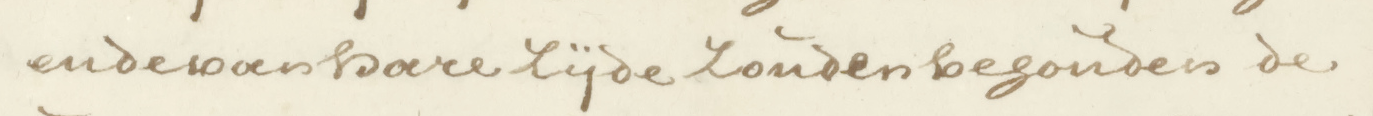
ende van hare zijde zouden behouden de
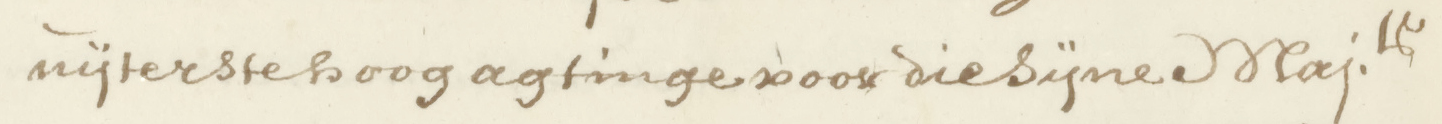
uijterste hoogagtinge voor die Sijne Majt
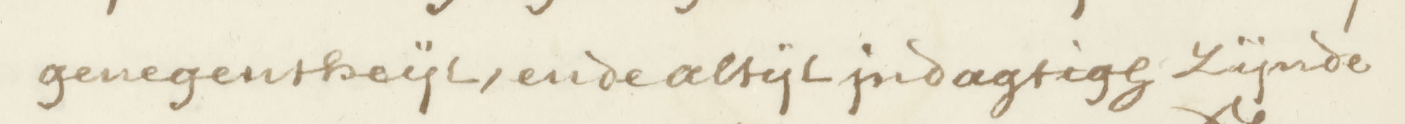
genegenheijt, ende altijt indagtigh zijnde
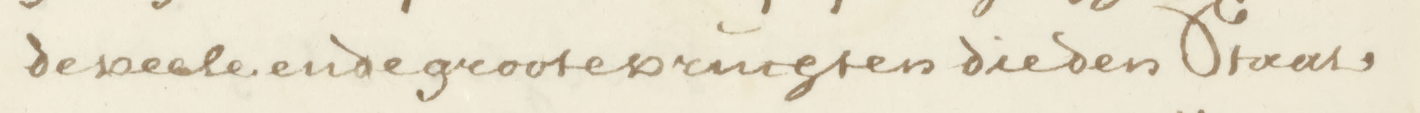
de veele ende groote vruchten die den Staat
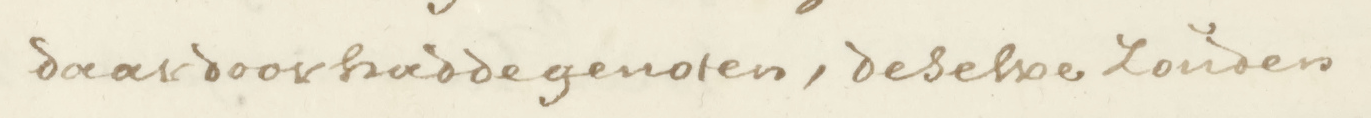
daar door hadde genoten, deselve zouden
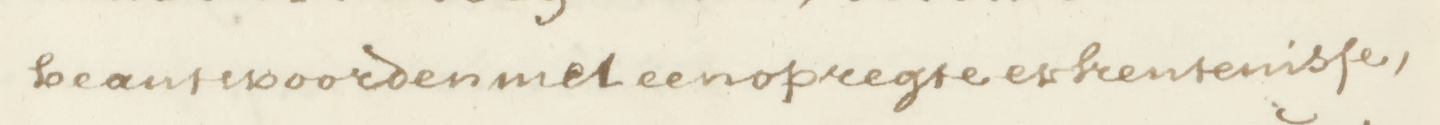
beantwoorden met een opregte erkentenisse
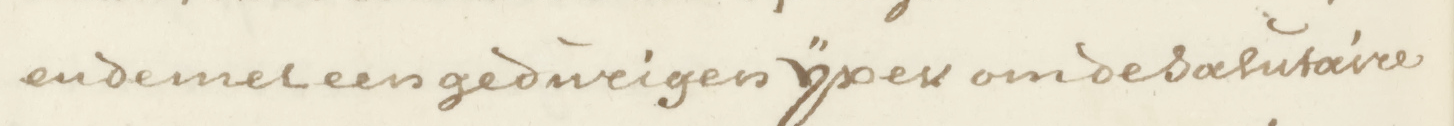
ende met een gedurigen ijver om de salutaire
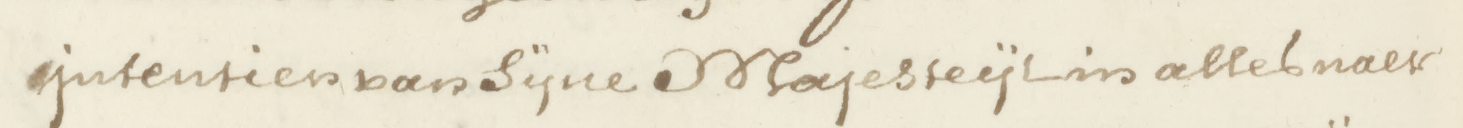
intentien van Sijne Majesteijt in alles naer
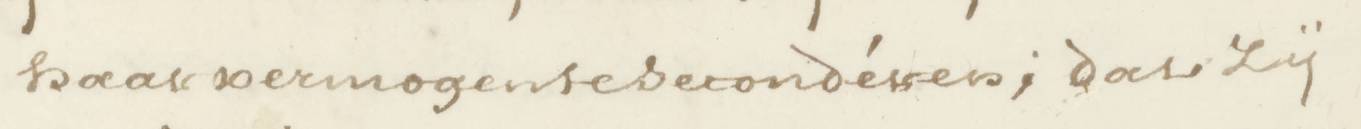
haar vermogen te seconderen; dat zij
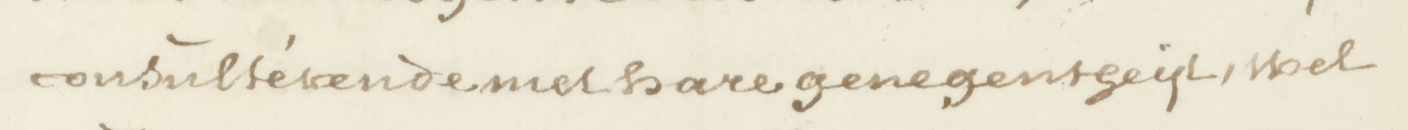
consulterende met hare genegentheijt, wel
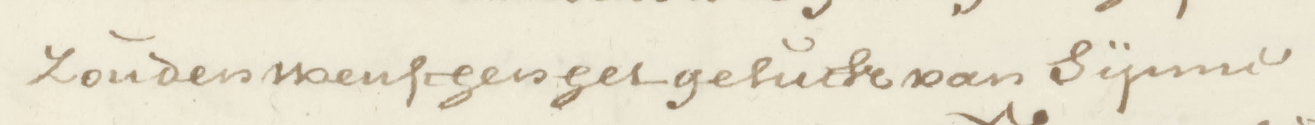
zouden wenschen het geluck van Sijne
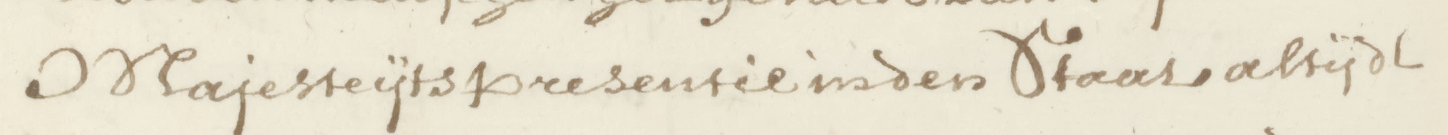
Majesteijts presentie in den Staat altijdt
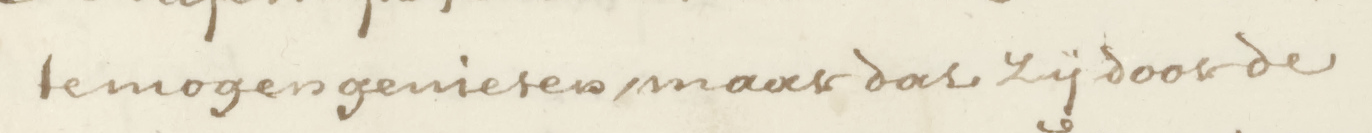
te mogen genieten, maar dat zij door de
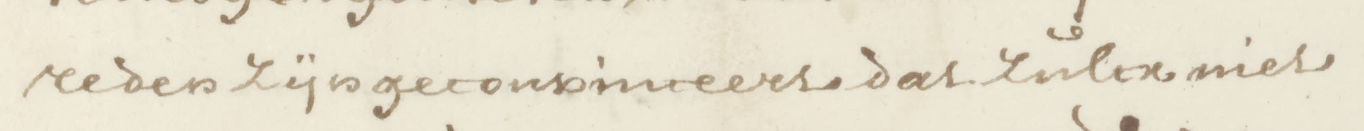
reden zijn geconvinceert dat zulcx niet
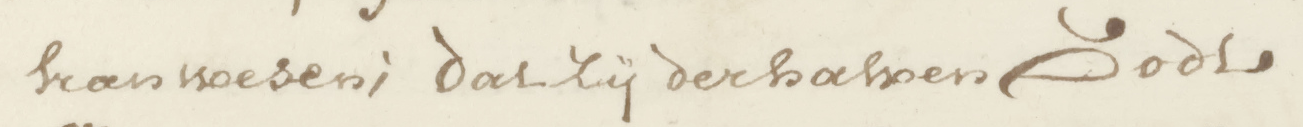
kan wesen; dat zij derhalven Godt
